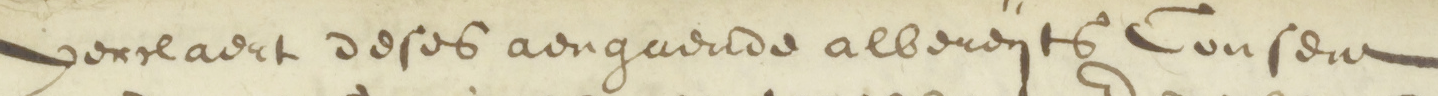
verclaert deses aengaende albereijts Consent
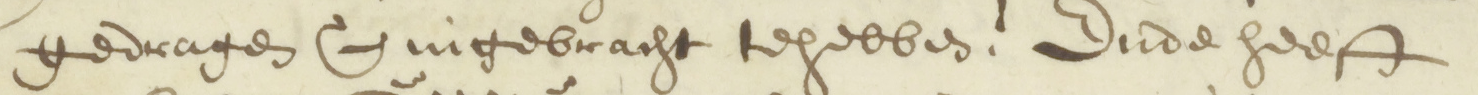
gedragen & ingebracht te hebben. Ende heeft
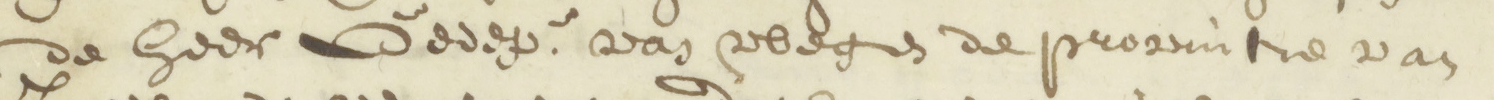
de heer Gedepe. van wegen de provintie van
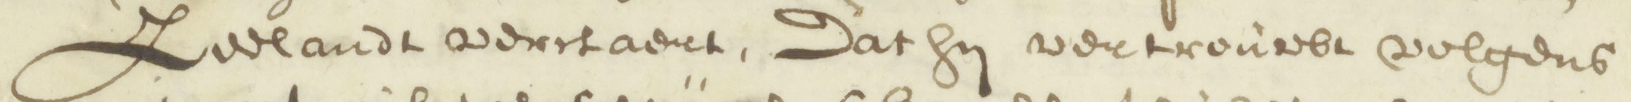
Zeelandt verclaert, Dat hij vertrouwetvolgens
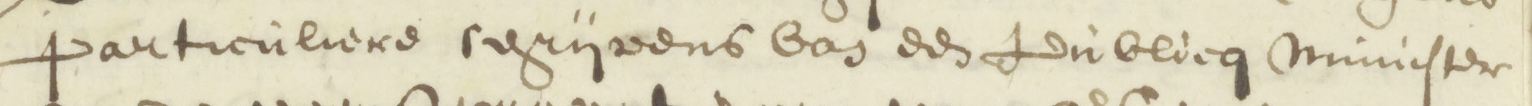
particuliere schrijvens van een Publicq Minister
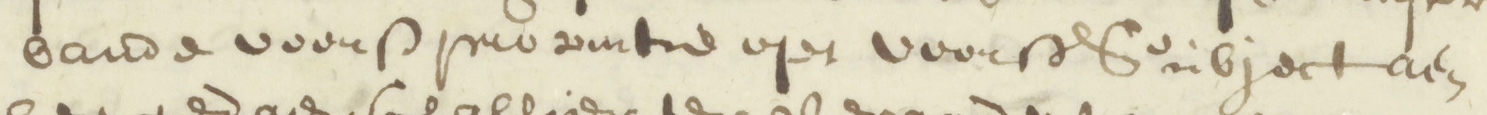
vande voors provintie opt voors subject aen
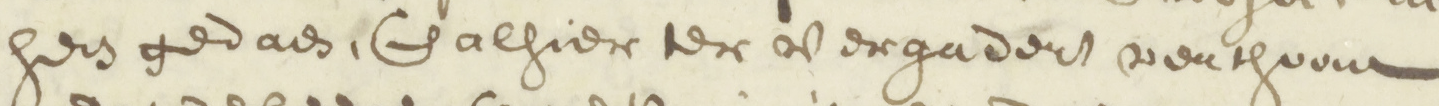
hen gedaen, & alhier ter vergader verthoont
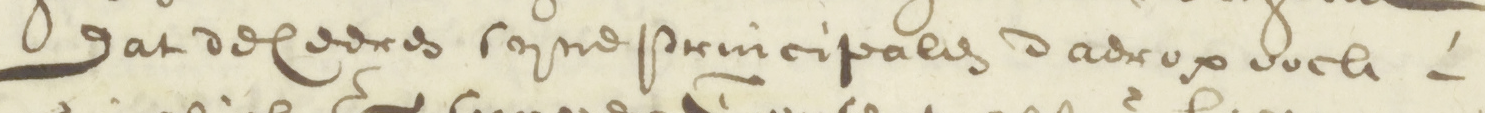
Dat de heeren sijne principalen daerop oock -
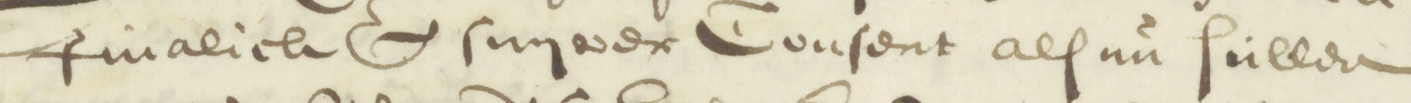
finalick & suijver Consent als nu sullen
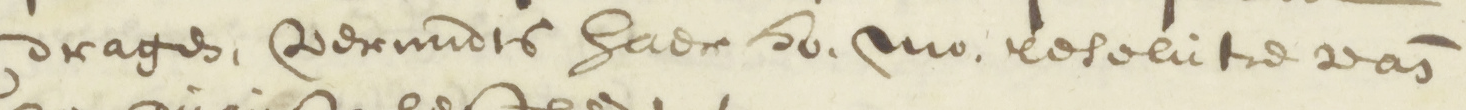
dragen, vermidts haer Ho.Mo. resolutie van
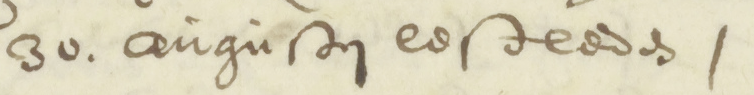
30. Augusty lestleden.
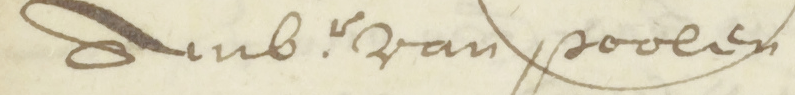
Ambr. van poolen
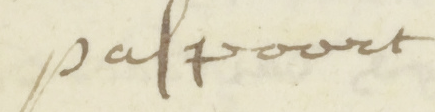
paspoort
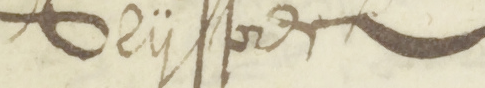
Slyspeck
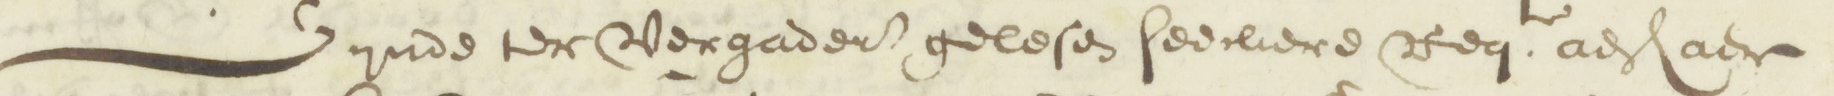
Sijnde ter Vergader gelesen seeckere reqte. aen haer
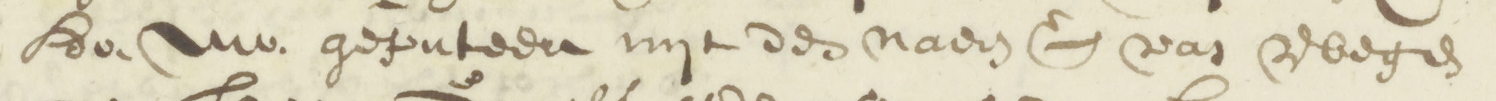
Ho.Mo. geputeer uijt den naem & van wegen
